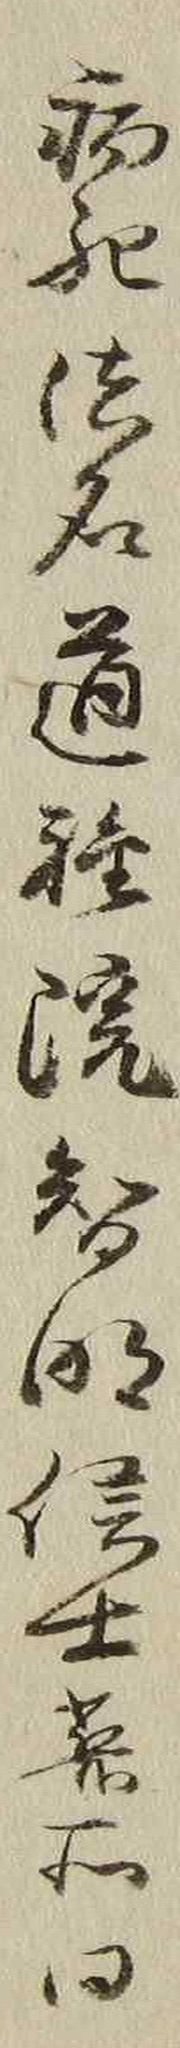病死法名道種院智明信士葬所同
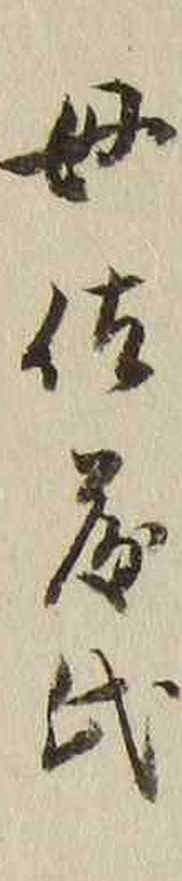母佐藤氏

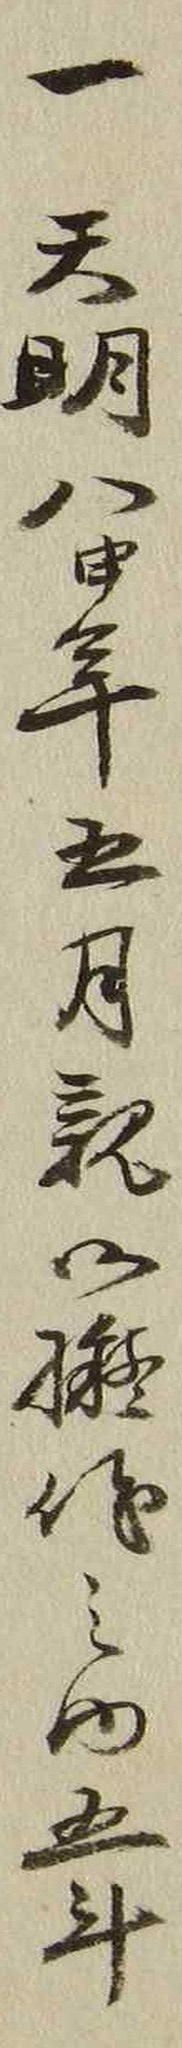一天明八申年五月親御擬作之内五斗
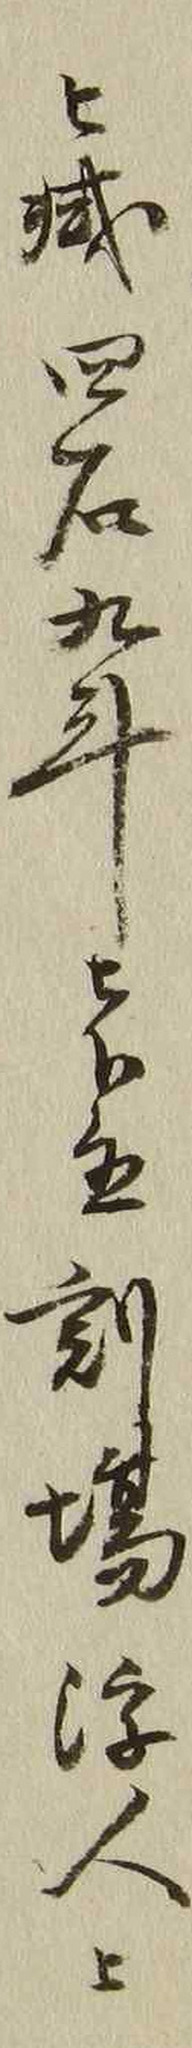被減四石九斗被下置割場浮人被
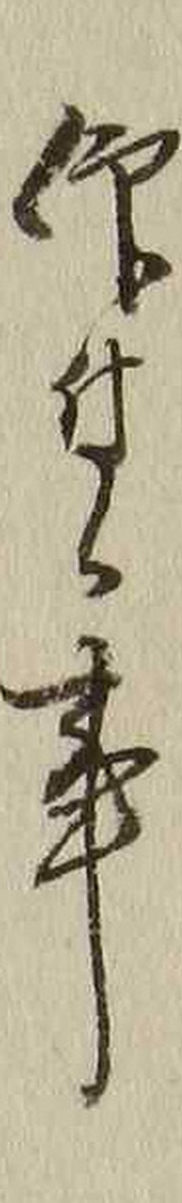仰付候事
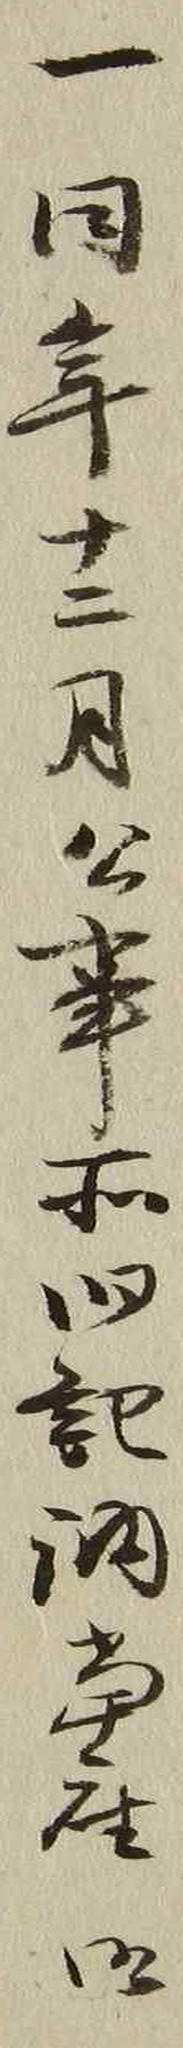一同年十二月公事所旧記調当座御
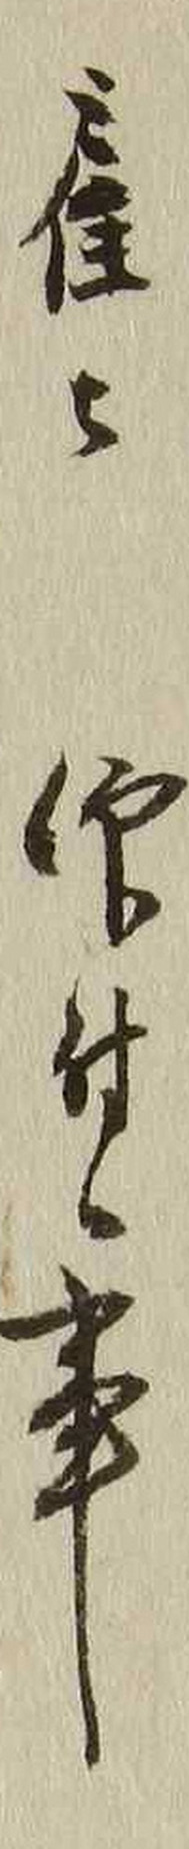雇被仰付候事
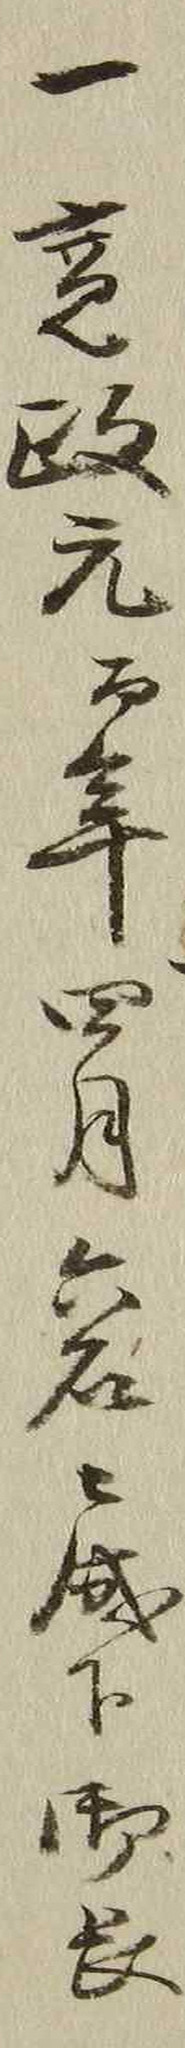一寛政元酉年四月六石被成下御長
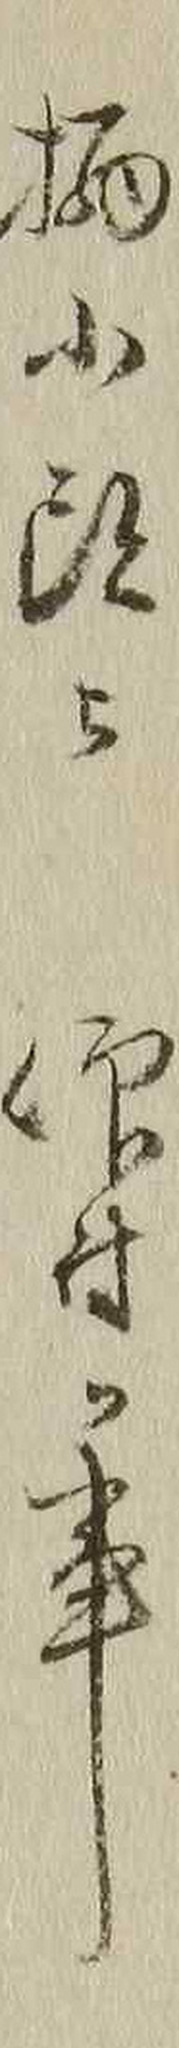柄小頭被仰付候事
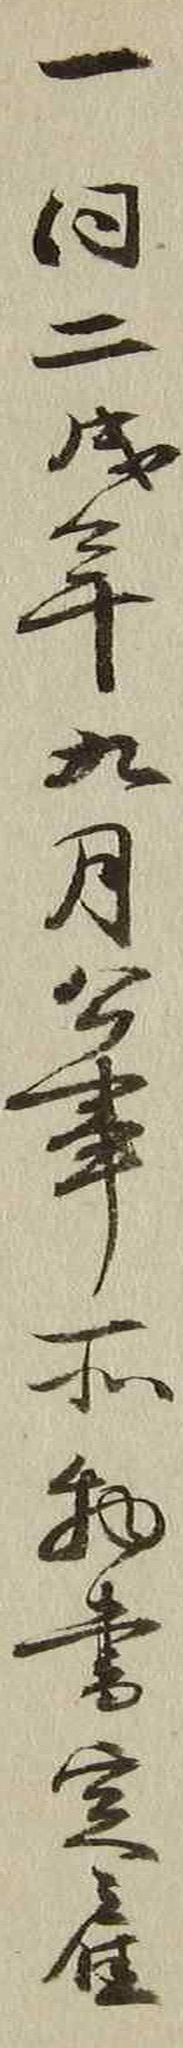一同二戌年九月公事所物書定雇
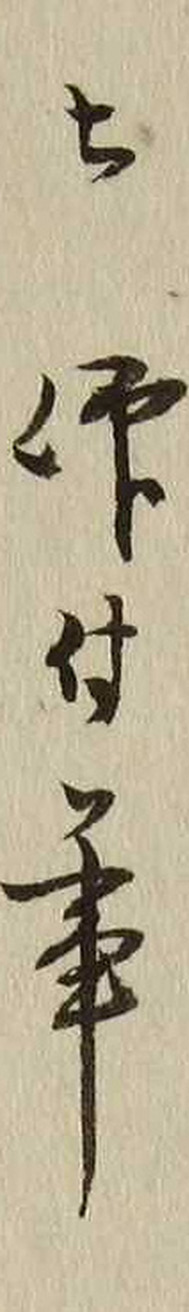被仰付候事
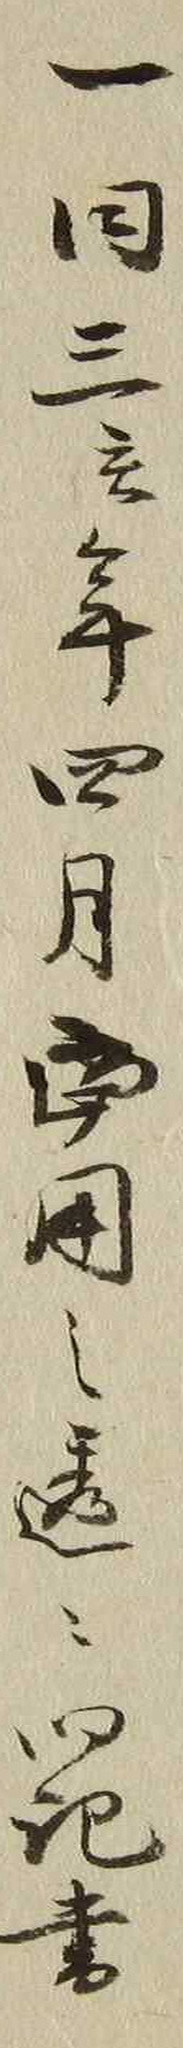一同三亥年四月当用之透ニ旧記書
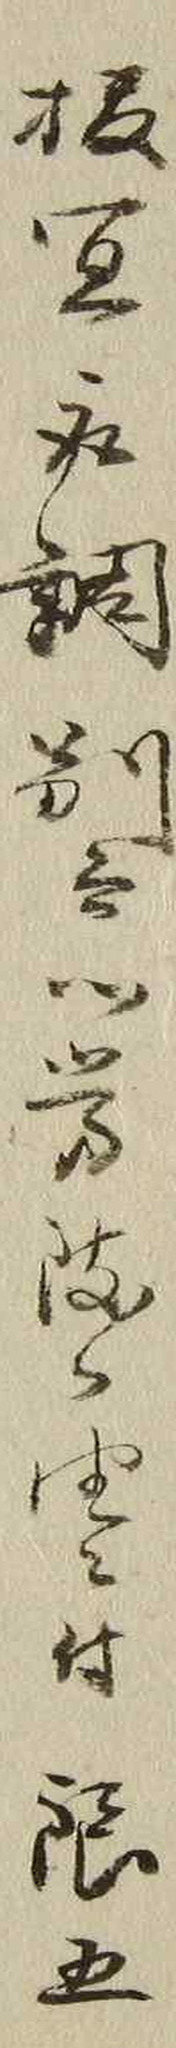抜宜取調別而心労致候由ニ付銀五
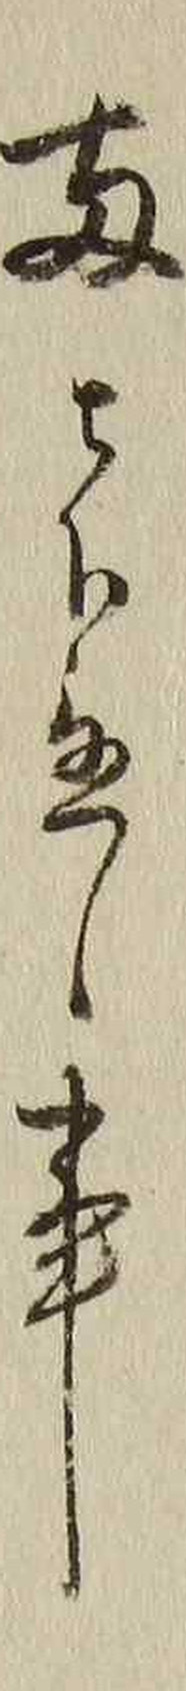両被下置候事
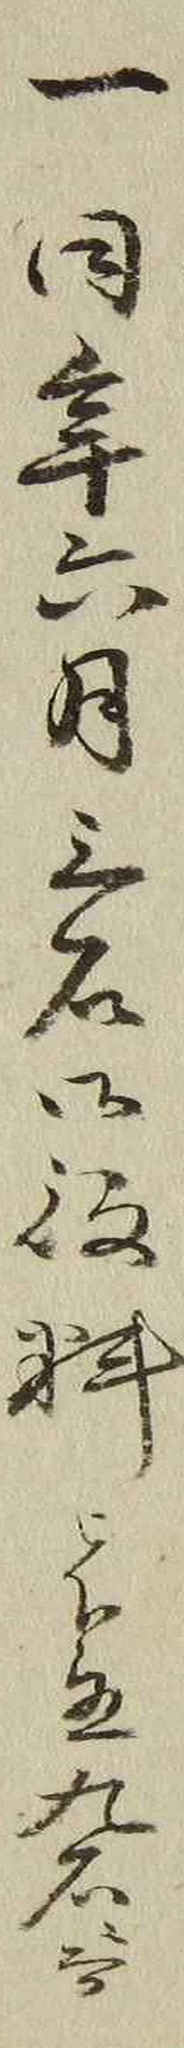一同年六月三石御役料被下置九石ニ而
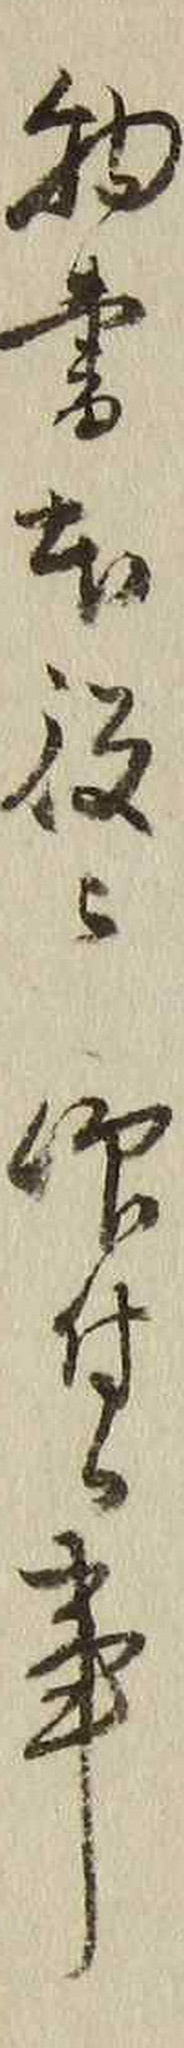物書本役被仰付候事
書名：諸士系譜　巻之236　ふ之部4
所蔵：会津若松市立会津図書館
